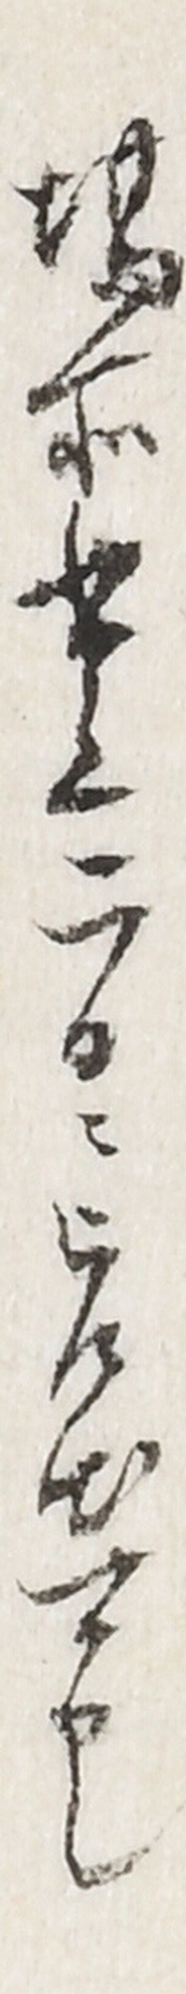場所書上二日ニ差出可申候
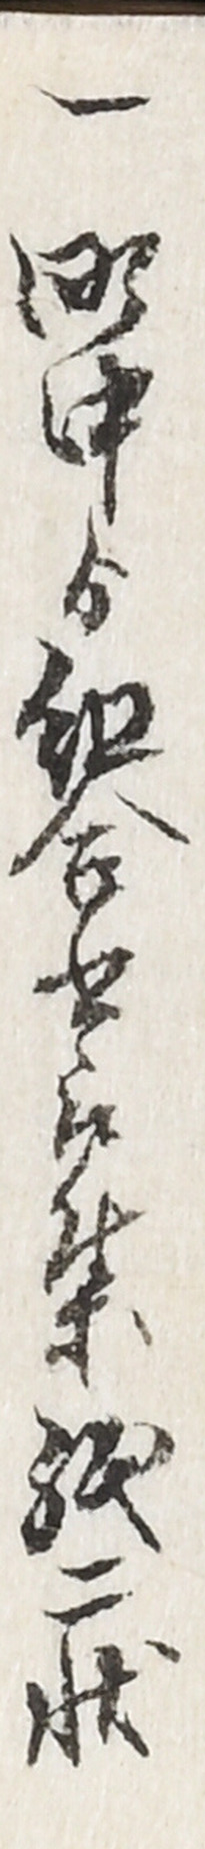一町中より組合書取集紙二状
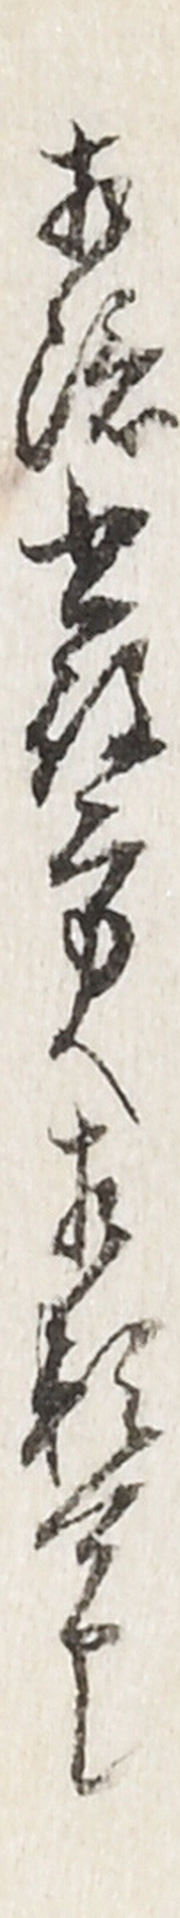相添書役方へ相頼可申候
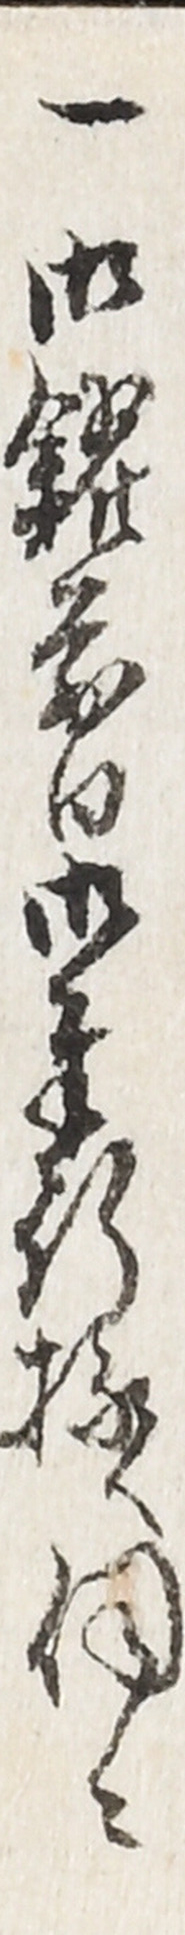一御鑼前日御奉行様へ伺ニ
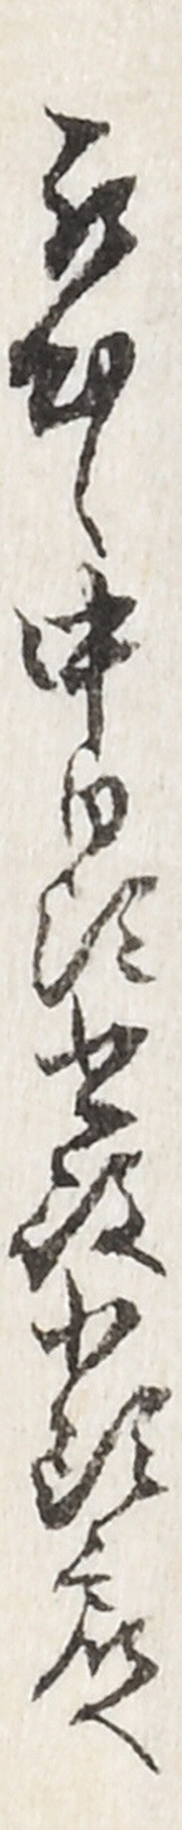罷出候中日頃書役小頭衆へ
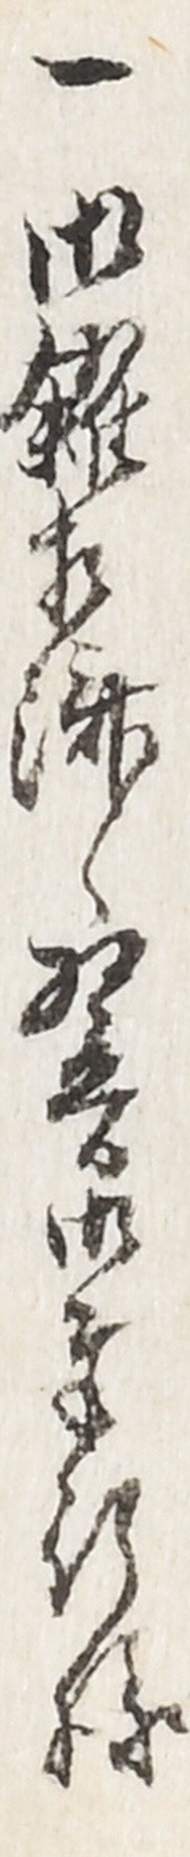一御雑相済候翌日御奉行様
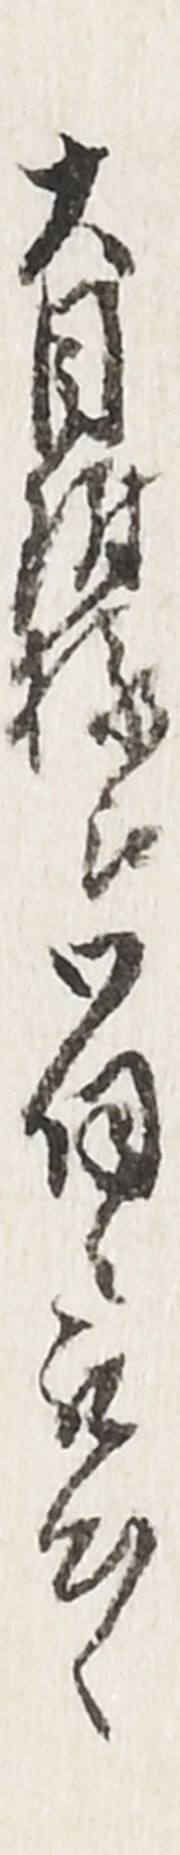大目附様江御伺へ罷出候
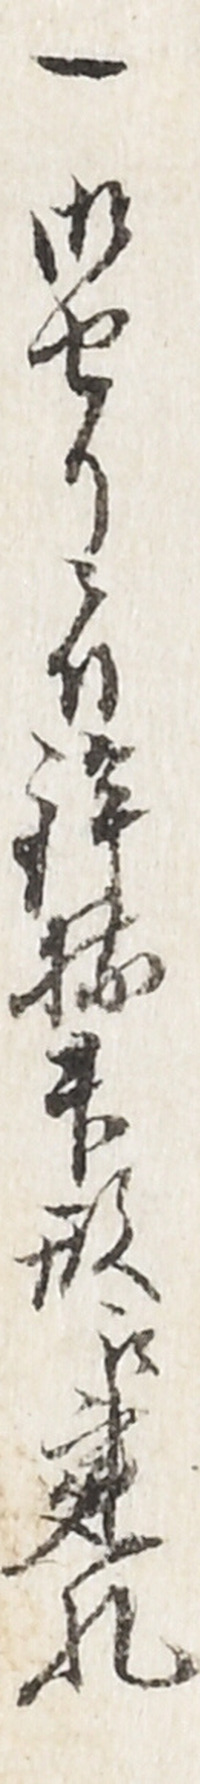一御せりニ付鉾持印形江建札
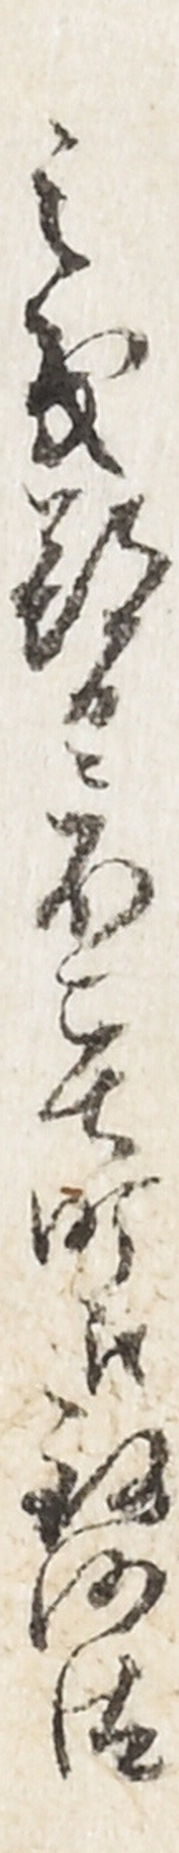之義朔日ニ不町江致沙汰

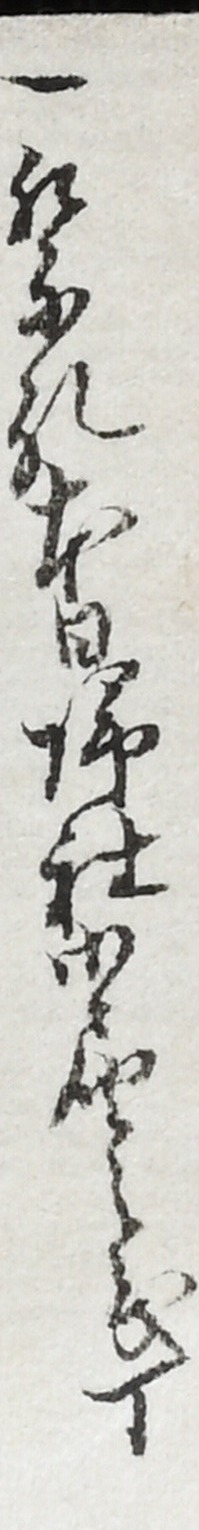一祭礼本日帰社御届け之義丁
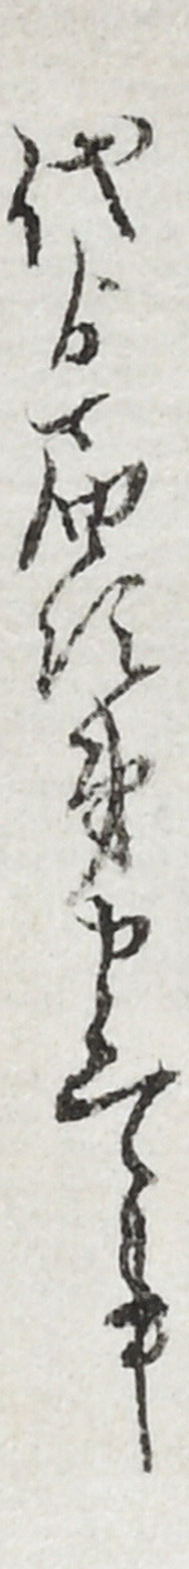代より届次第申上候事
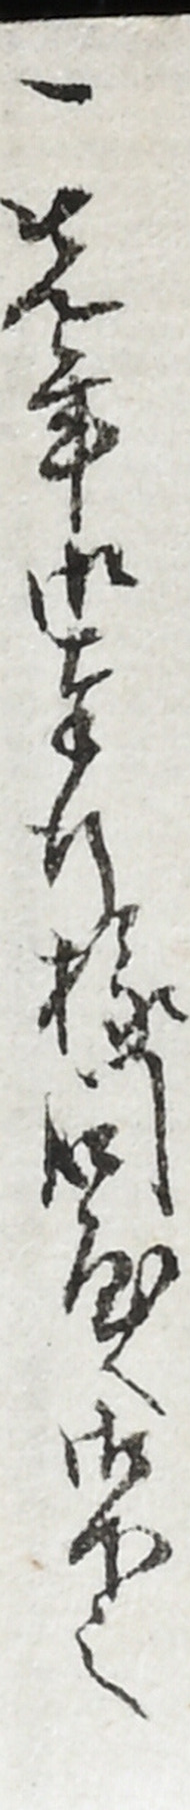一先年御奉行様問屋へ御下也
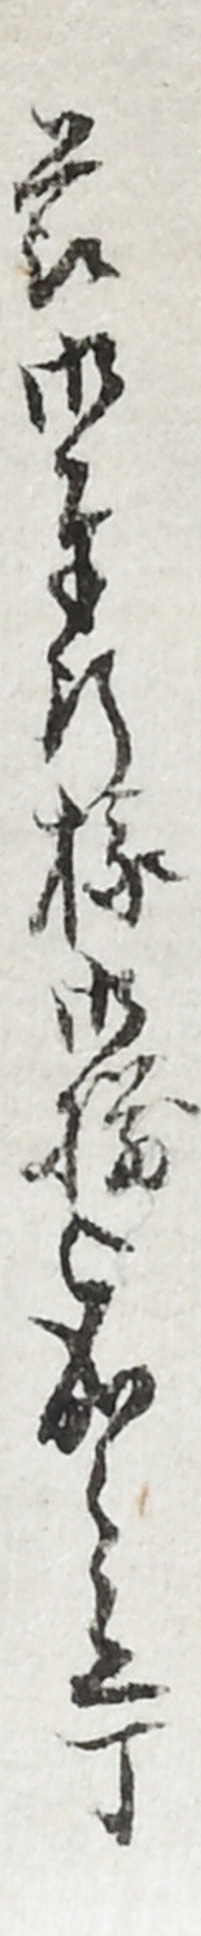節御奉行様御揃被成之覚丁
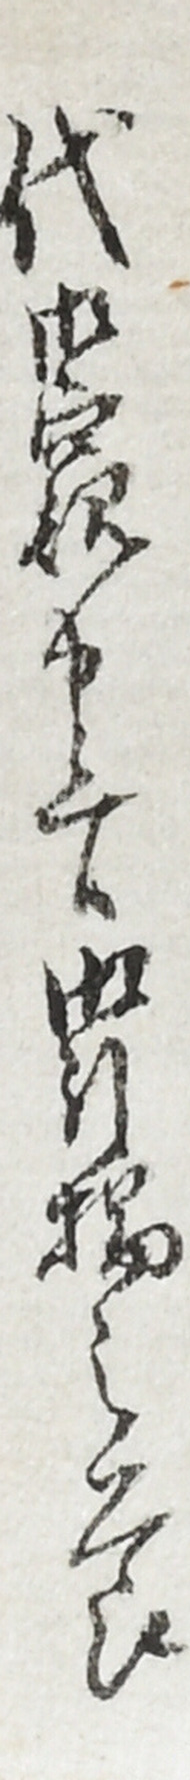代御窺申上候御引揚之節
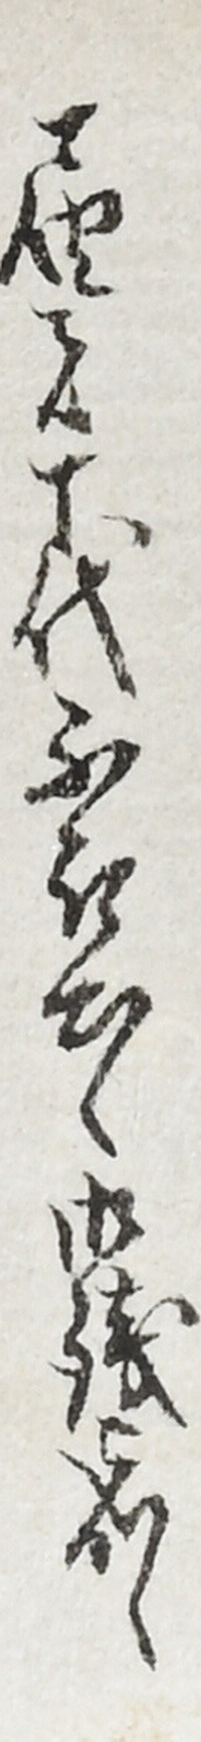届は丁代不被出候御銭被成候
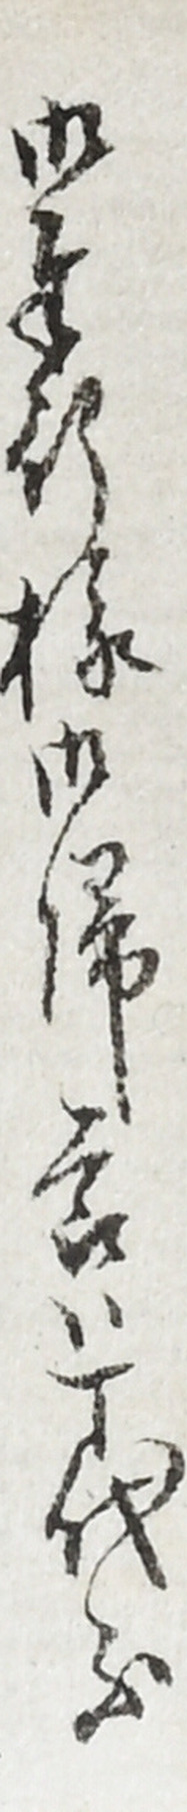御奉行様御帰節ハ丁代不
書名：年内行事懐中録
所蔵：伊那市立高遠町図書館・合同会社AMANE
